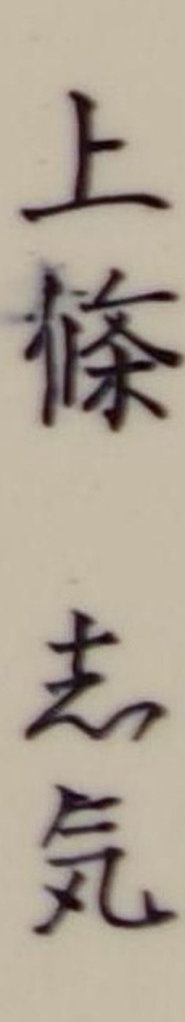上條志気
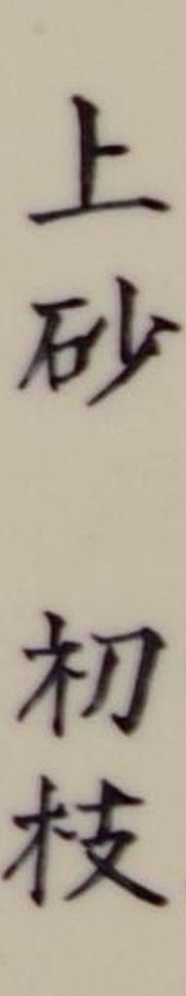上砂初枝
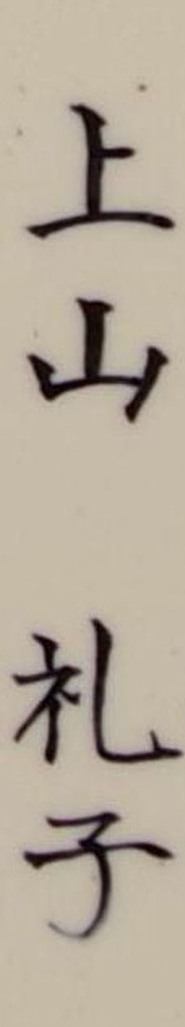上山礼子
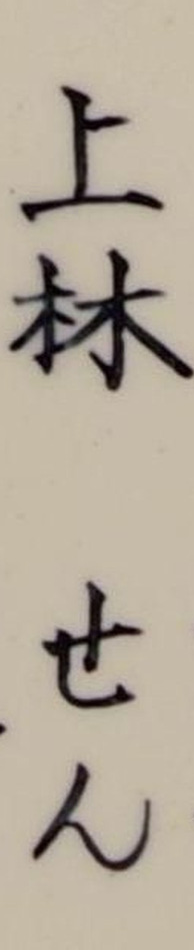上林せん
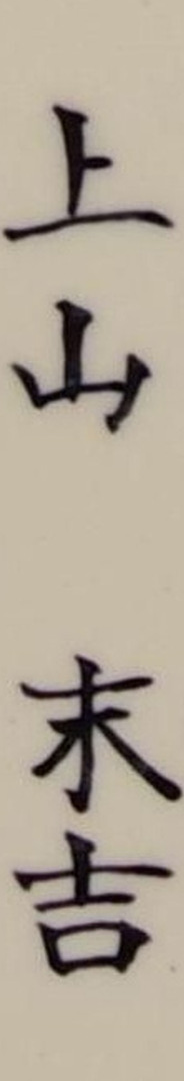上山末吉
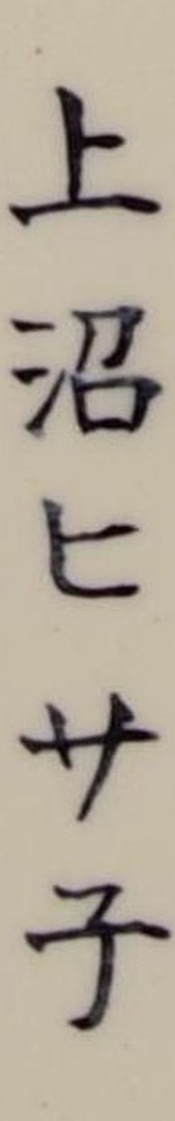上沼ヒサ子
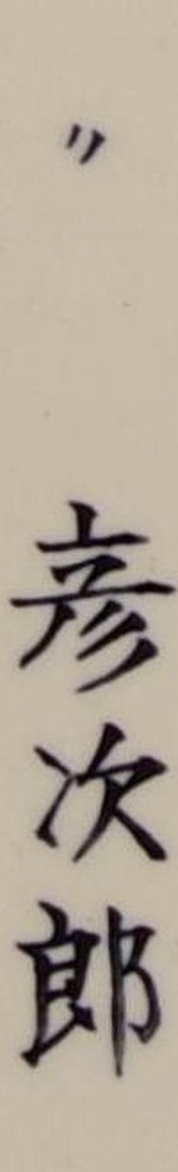彦次郎
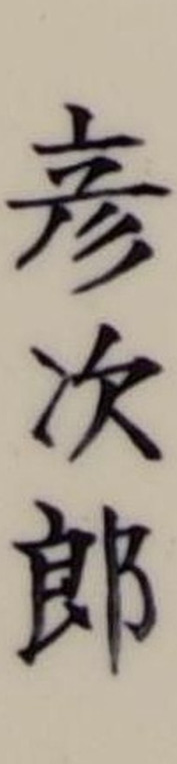彦次郎
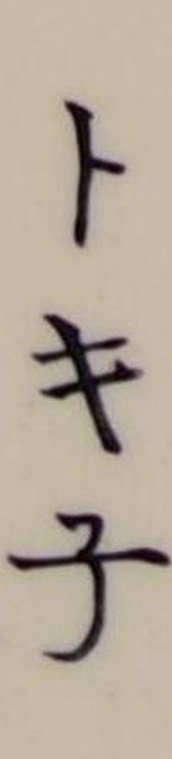トキ子
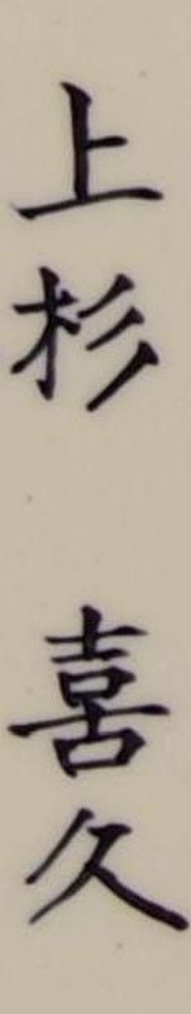上杉喜久
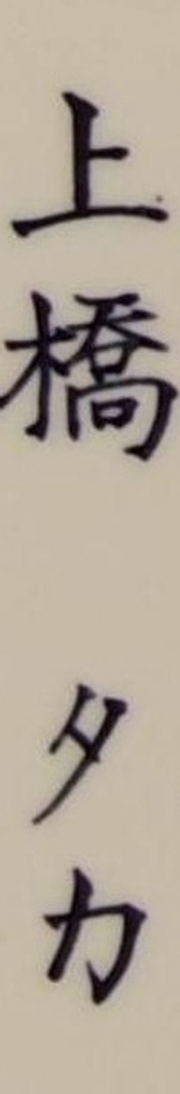上橋タカ
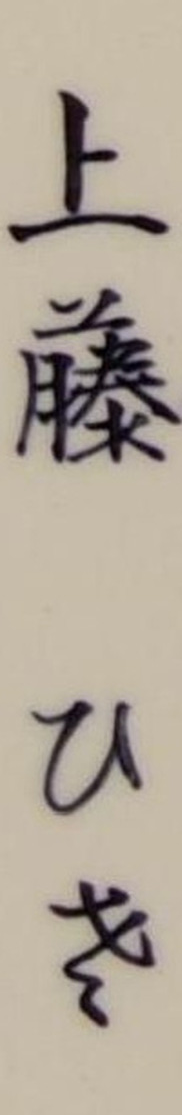上藤ひさ
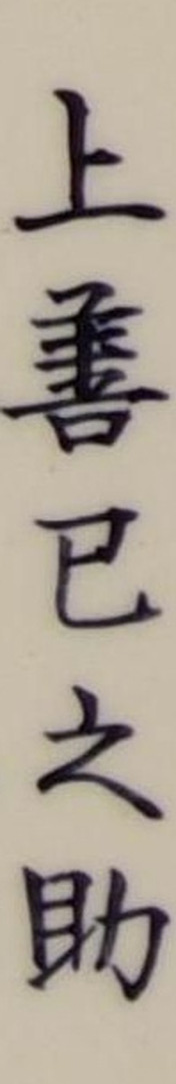上善巳之助
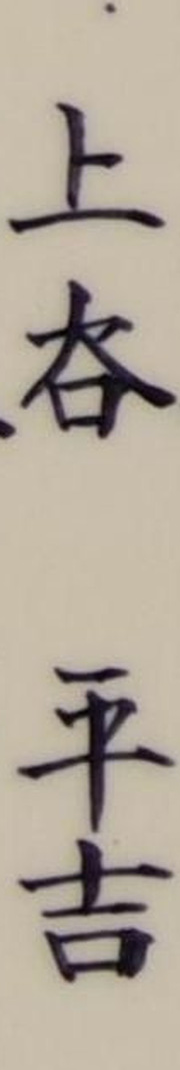上谷平吉
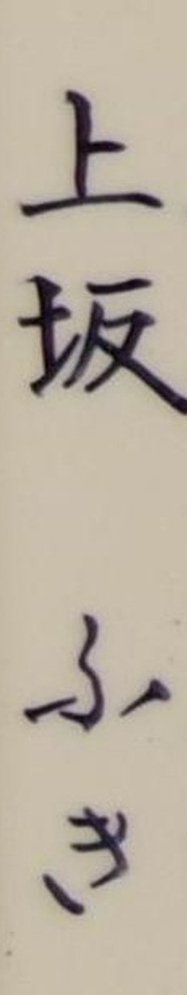上坂ふき

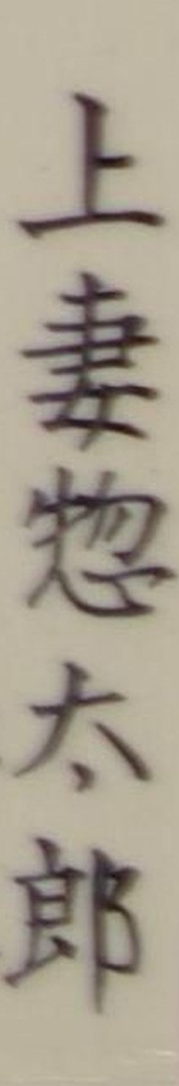上妻惣太郎
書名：M~S
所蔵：高野山金剛峯寺
